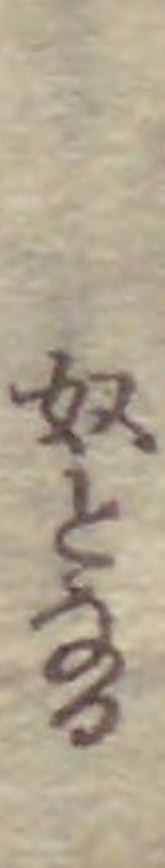奴となる
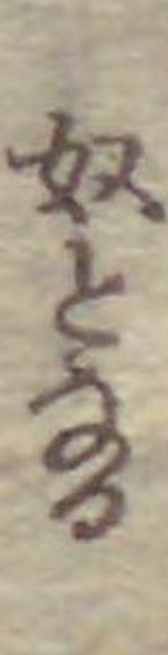奴となる
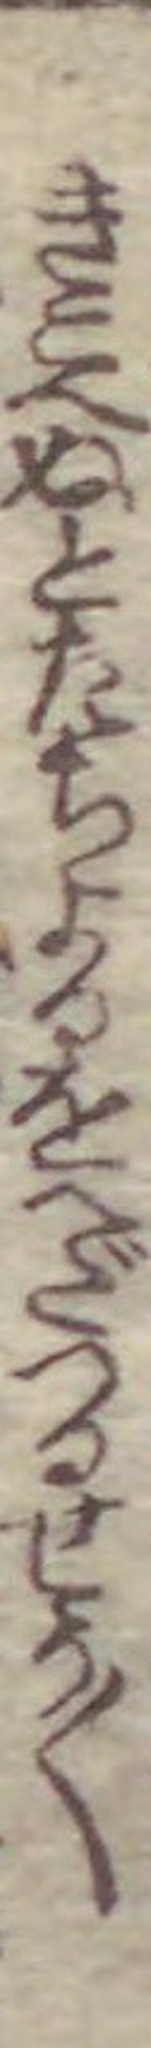きこへぬとたちよるをへだつるせう〳〵
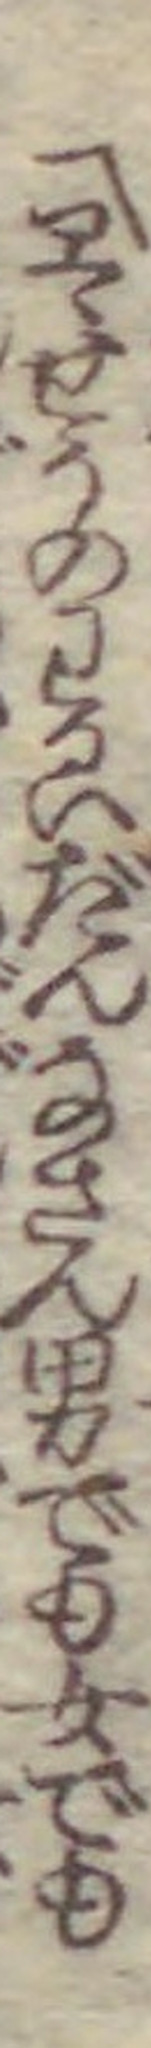〽ヱヽせうのわるいだんなさん男でも女でも
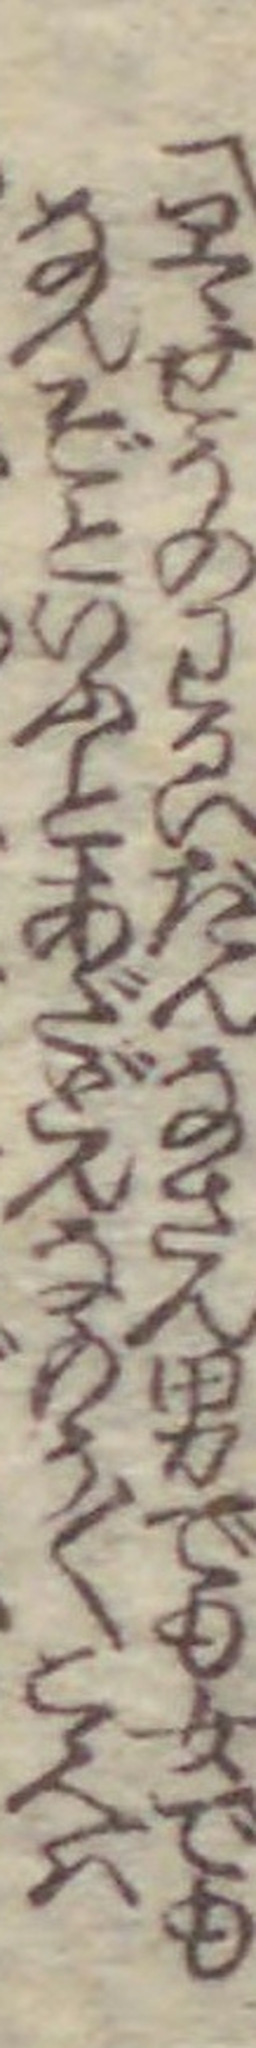なんぞといふとあだどんなもう〳〵こゝへは
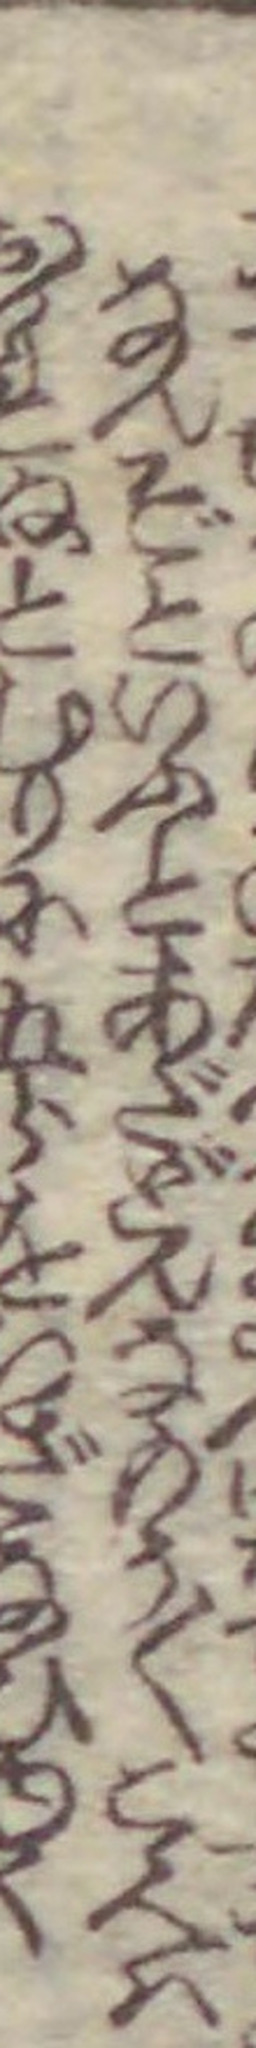おかれぬとむりに五郎をいざなひゆく
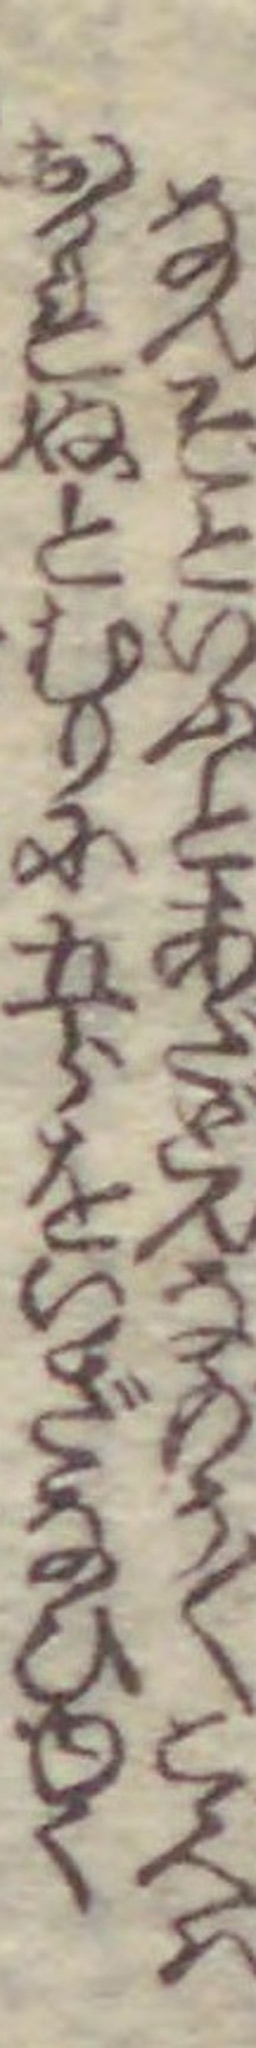おかれぬとむりに五郎をいざなひゆく
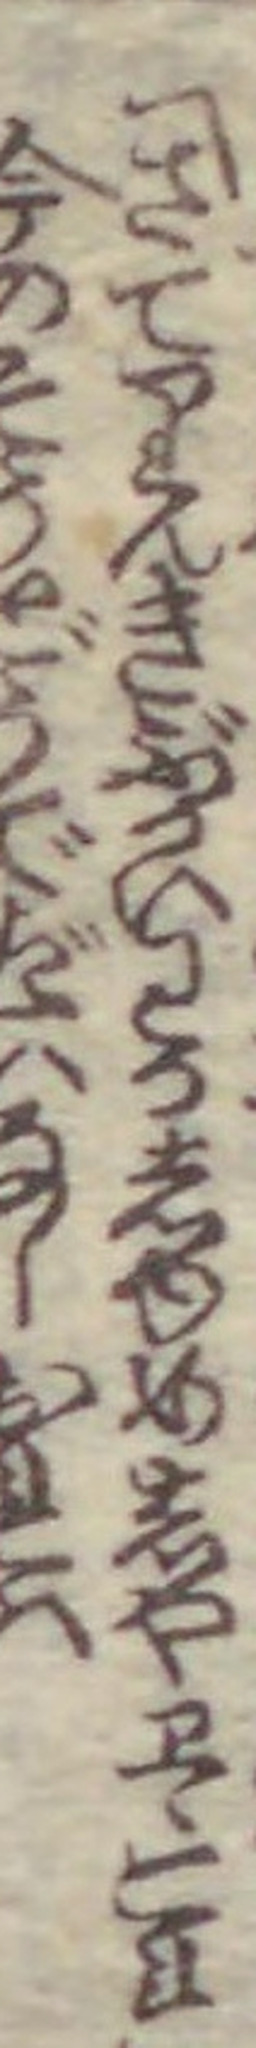今のそうどうでだいなしおれは
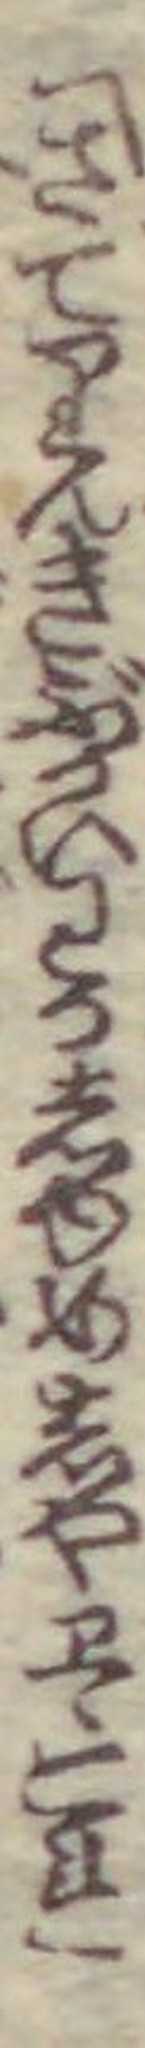〽さてりんきぶかいわかしゆめしやヱヽこれ
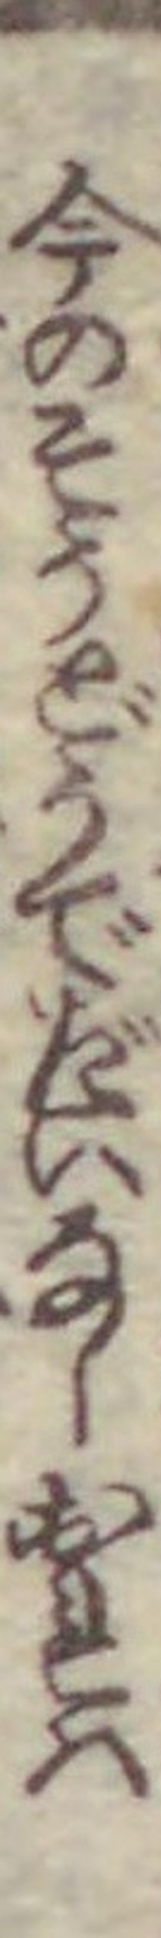今のそうどうでだいなしおれは
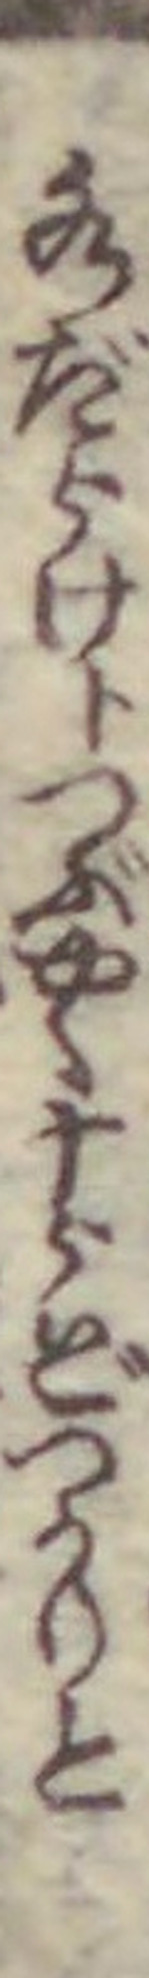水だらけとつぶやく十郎どつかりと
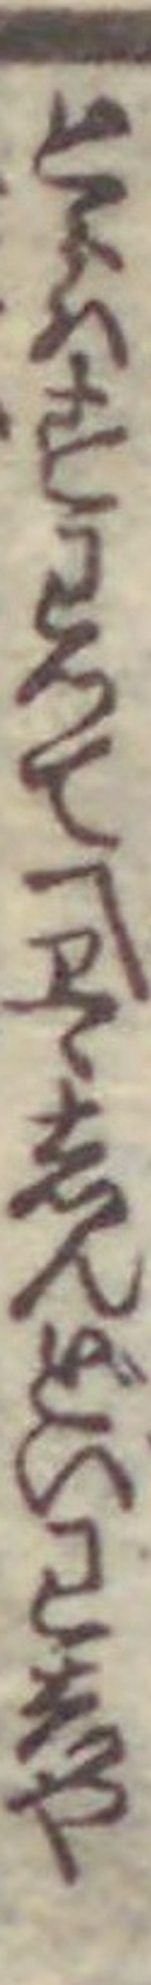とらはすわつて〽ヱヽしんどいわしや
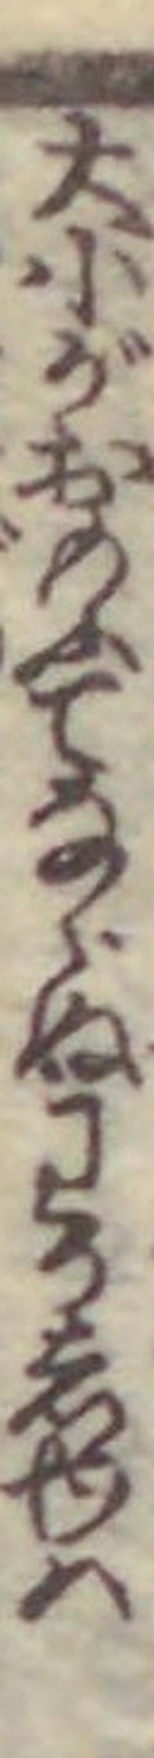大小がおもふてならぬわかしゆは
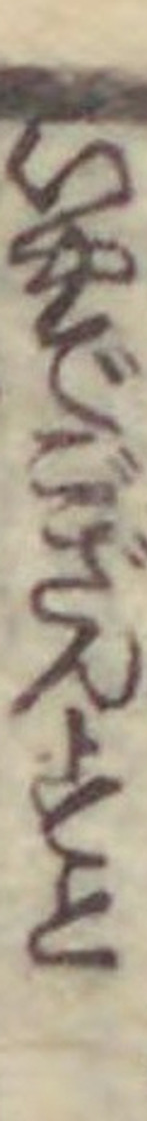いやでござんすと
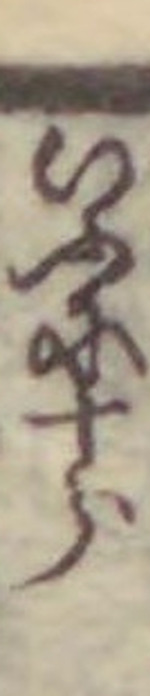いふに十郎
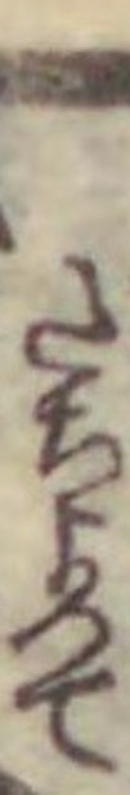たちよつて
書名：大時代唐土化物 3巻. 曽我太夫染
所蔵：国立国会図書館 National Diet Library, JAPAN
